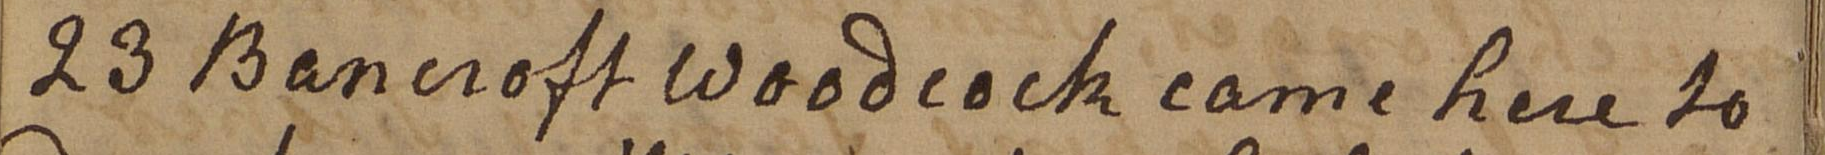23 Bancroft Woodcock came here to
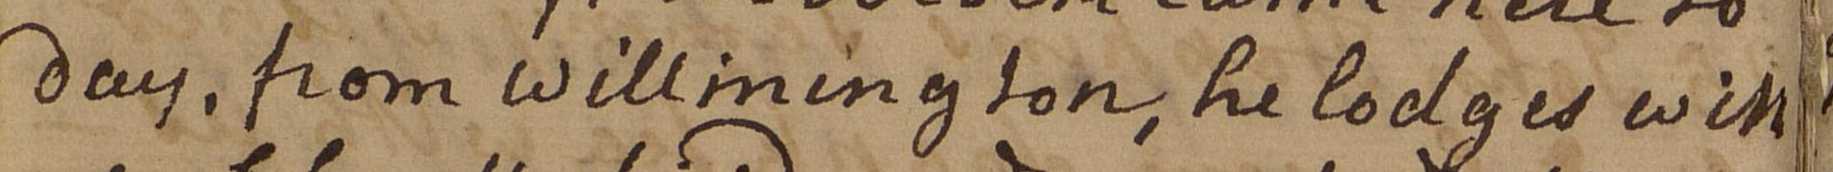day, from Willmington, he lodges with
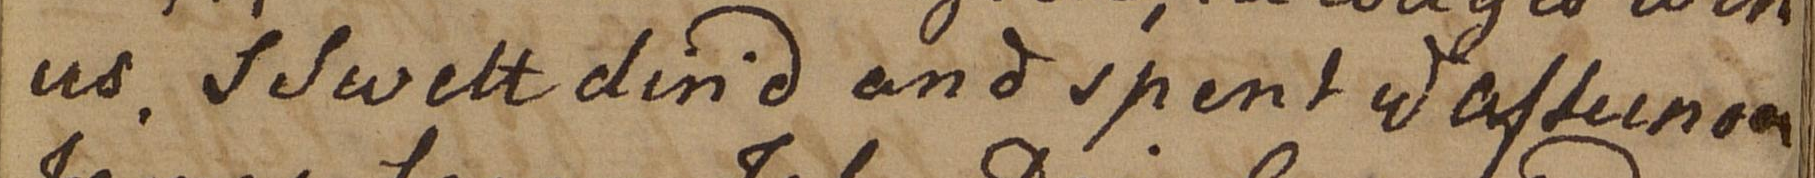us. S Swett din'd and spent y^e afternoo[_]
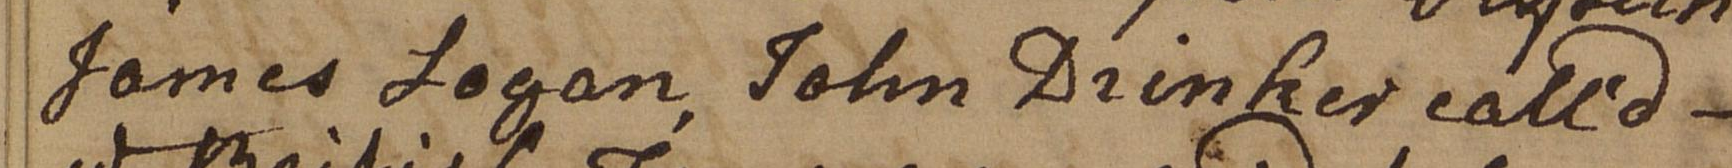James Logan, John Drinker call'd-
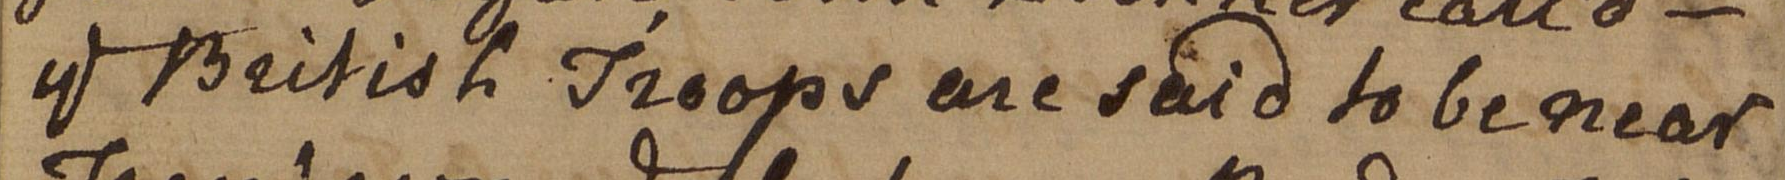y^e British Troops are said to be near
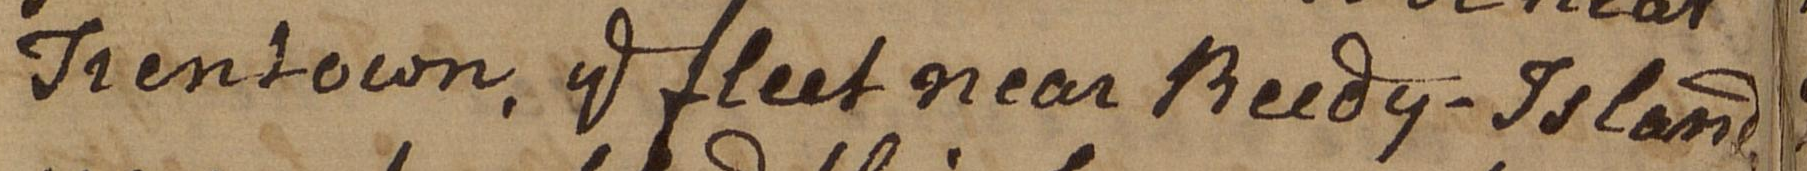Trentown, y^e fleet near Reedy- Island
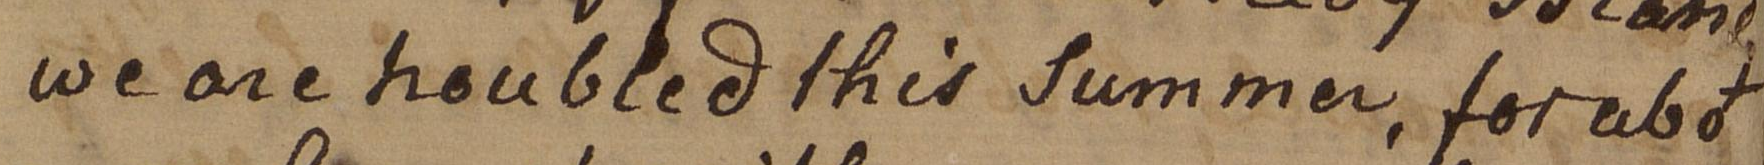we are troubled this Summer, for abot
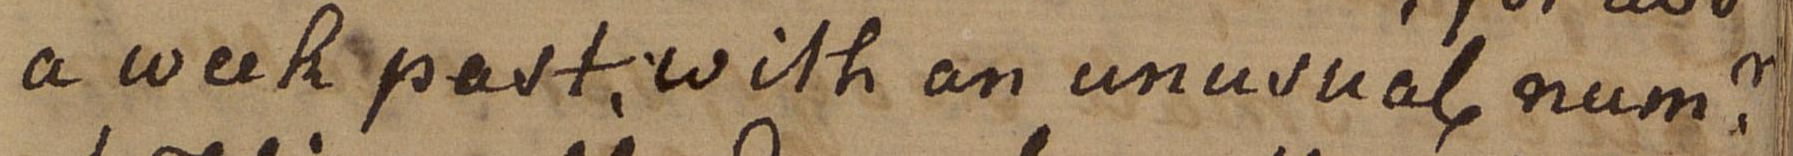a week past with an unusual num^r.
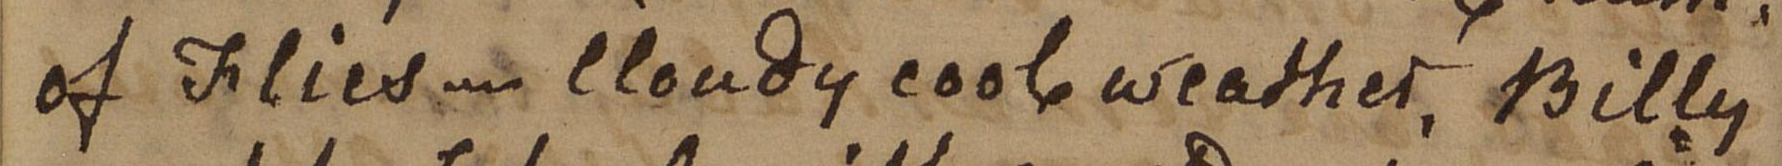of Flies- Cloudy cool weather, Billy
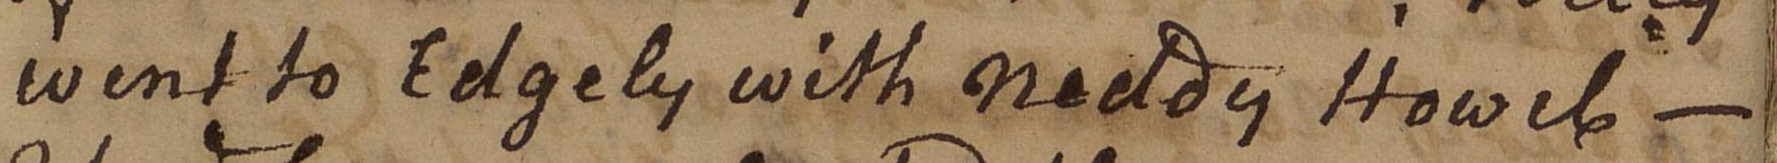went to Edgely with Neddy Howel-
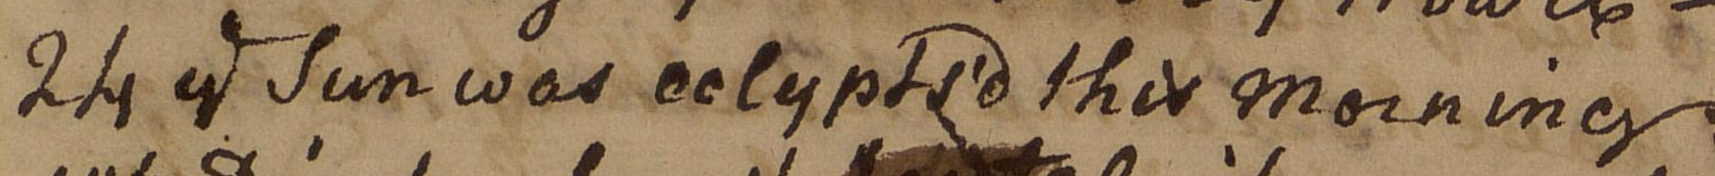24 y^e Sun was eclypts'd this Morning
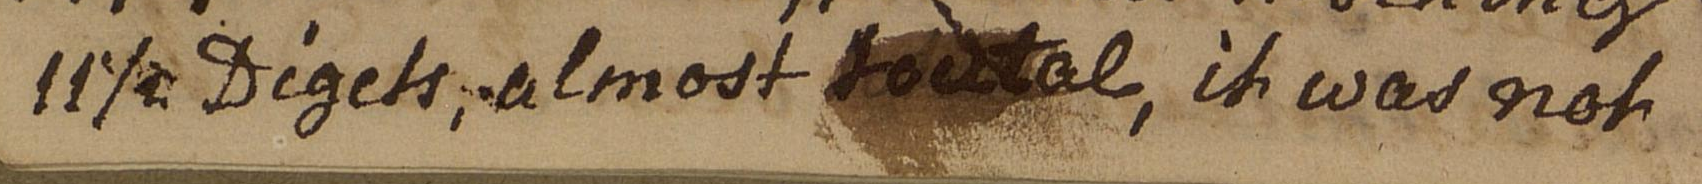11 1/2 Digets, almost toutal, it was not
